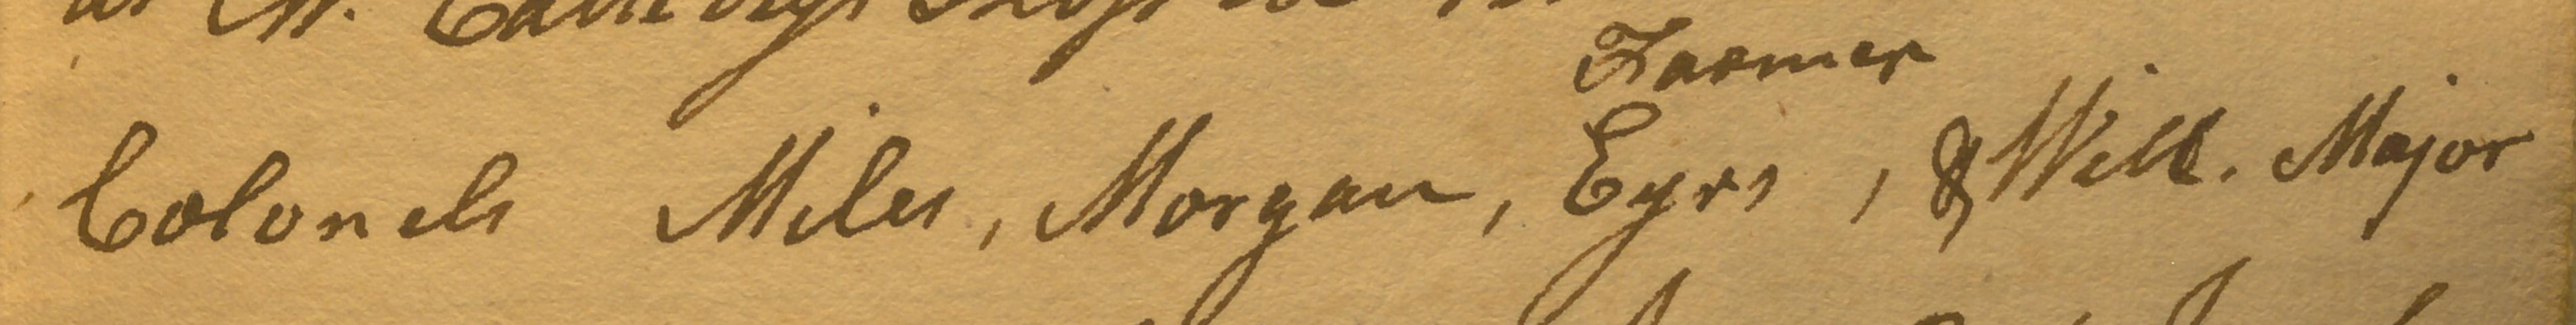Colonels Miles, Morgan, Eyrs, & Will. Major
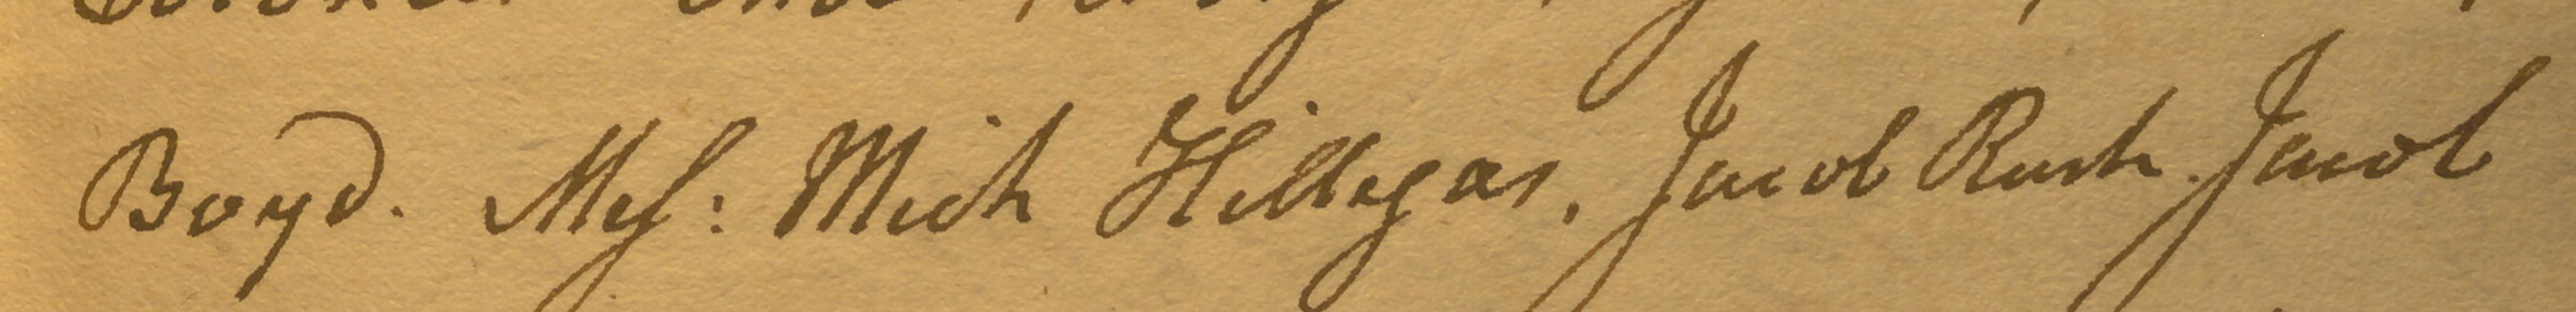Boyd. Mes: Mich Hillegas, Jacob Rush Jacob
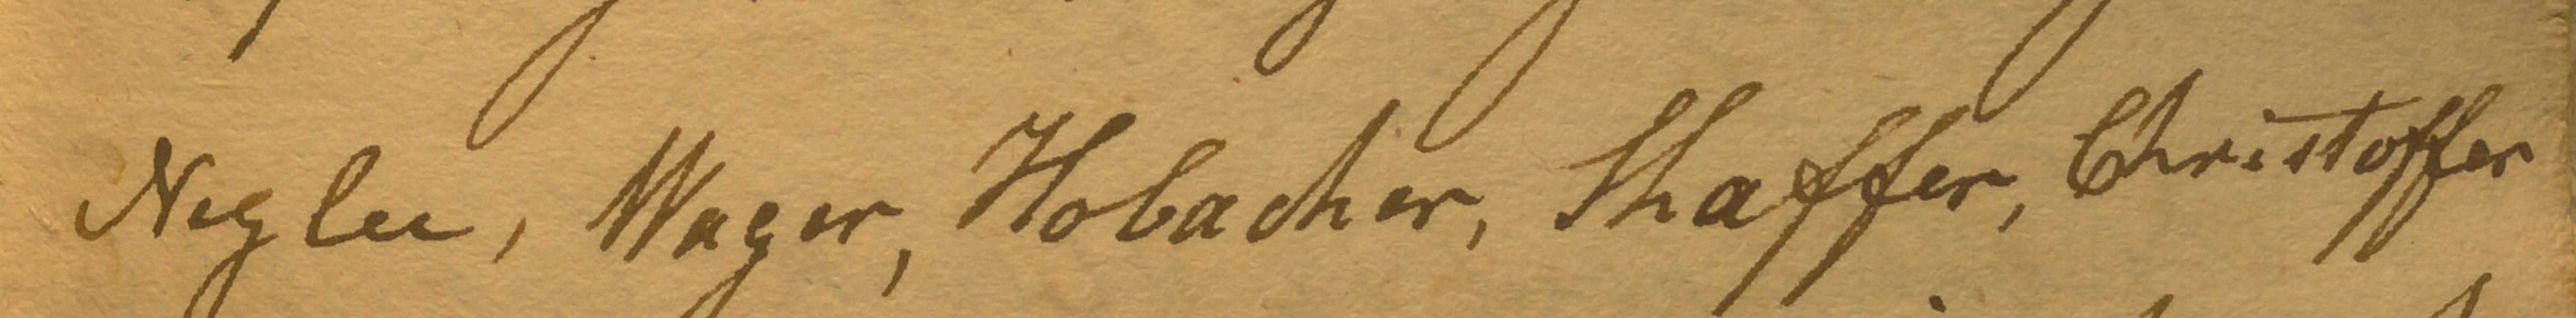Neglee, Wager Hobacker, Shaffer, Christoffer
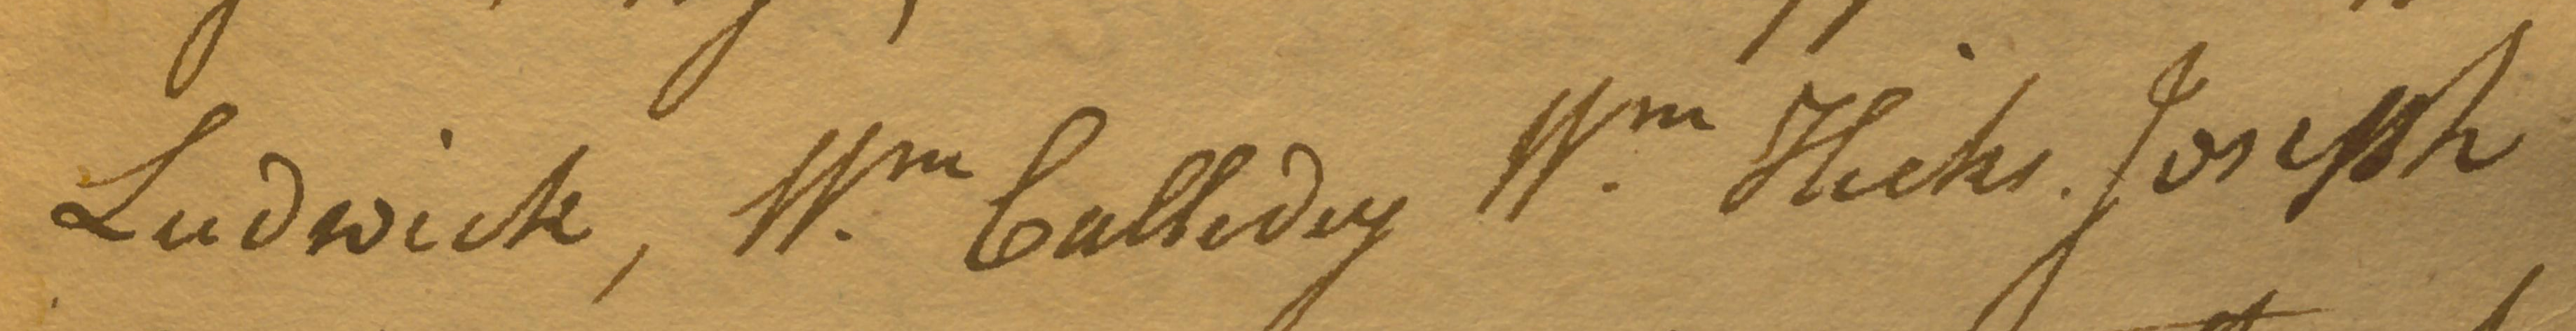Ludwick, W^m. Callidey W^m. Hicks Joseph
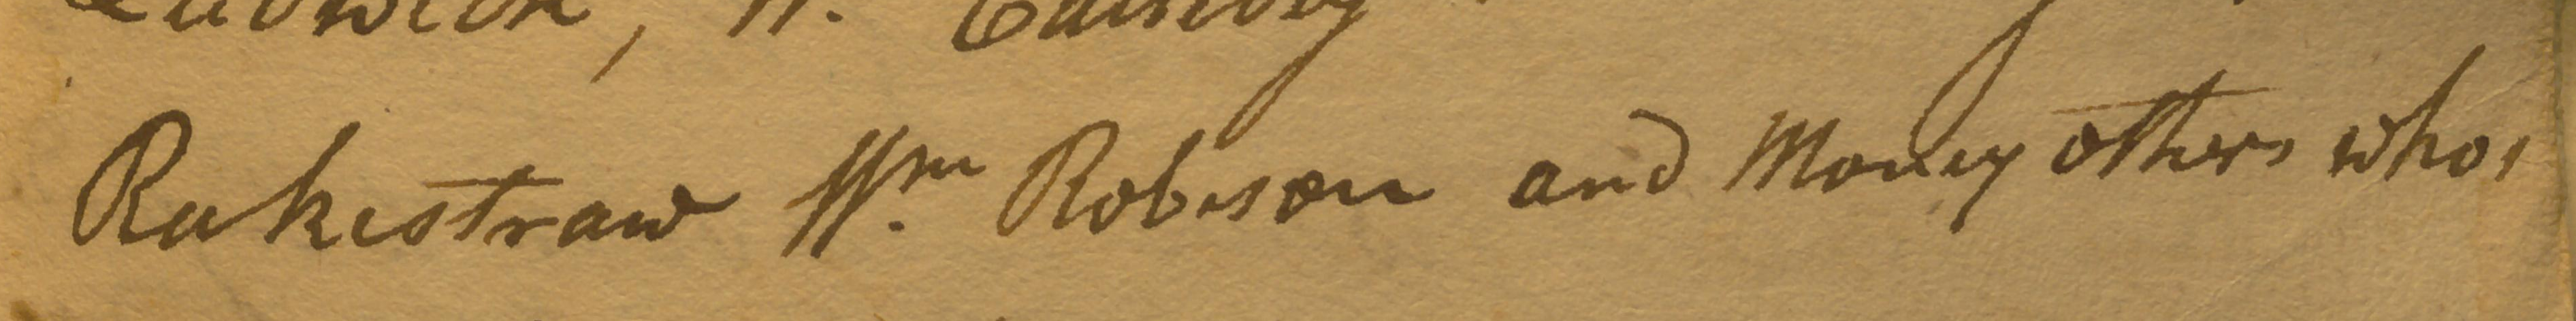Rakestraw W^m. Robison and Maney others whos
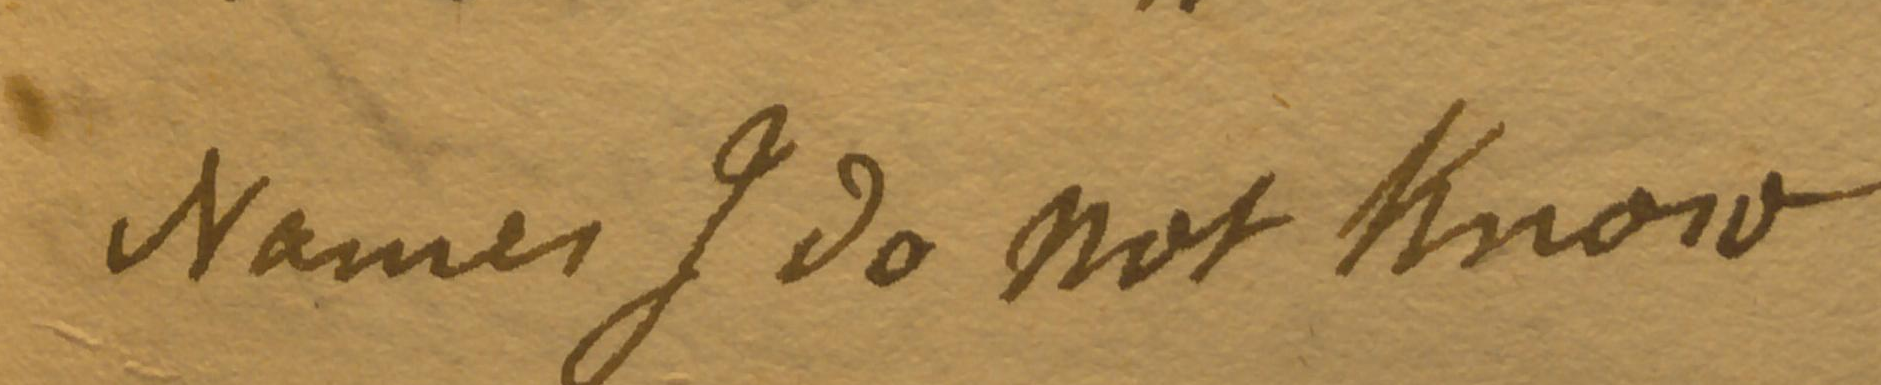Names I do not Know
